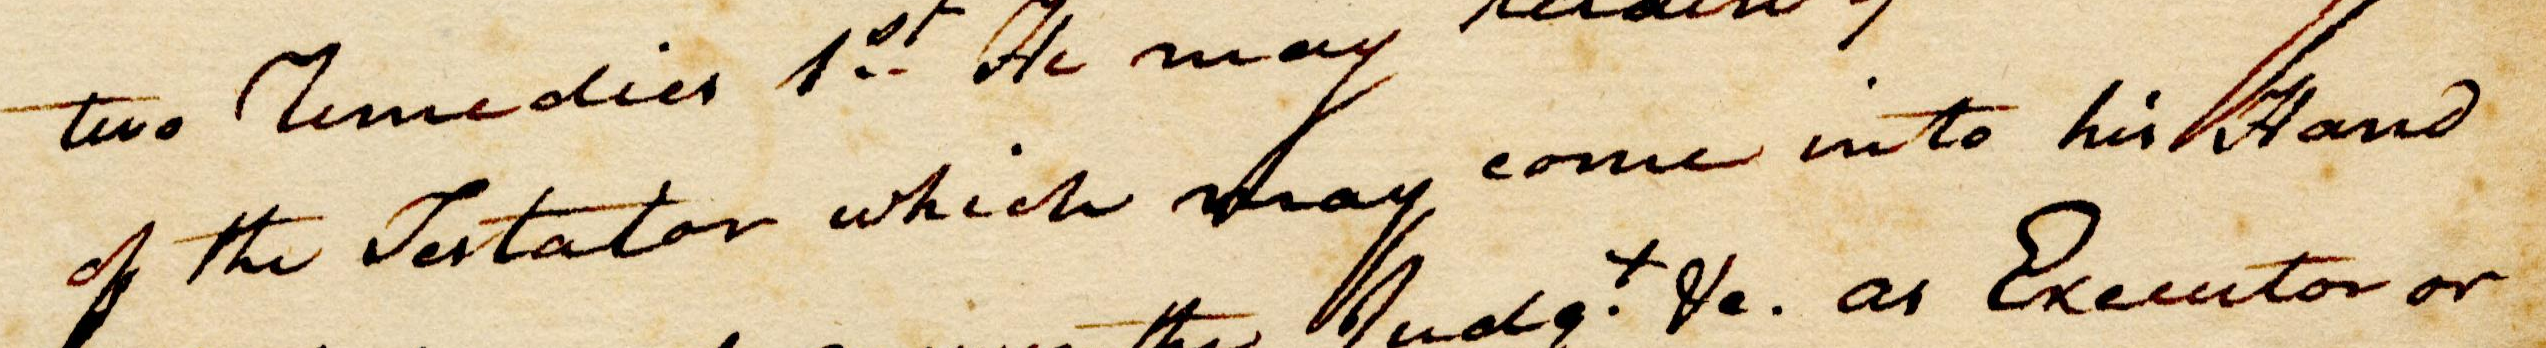of the Testator which may come in to his hand
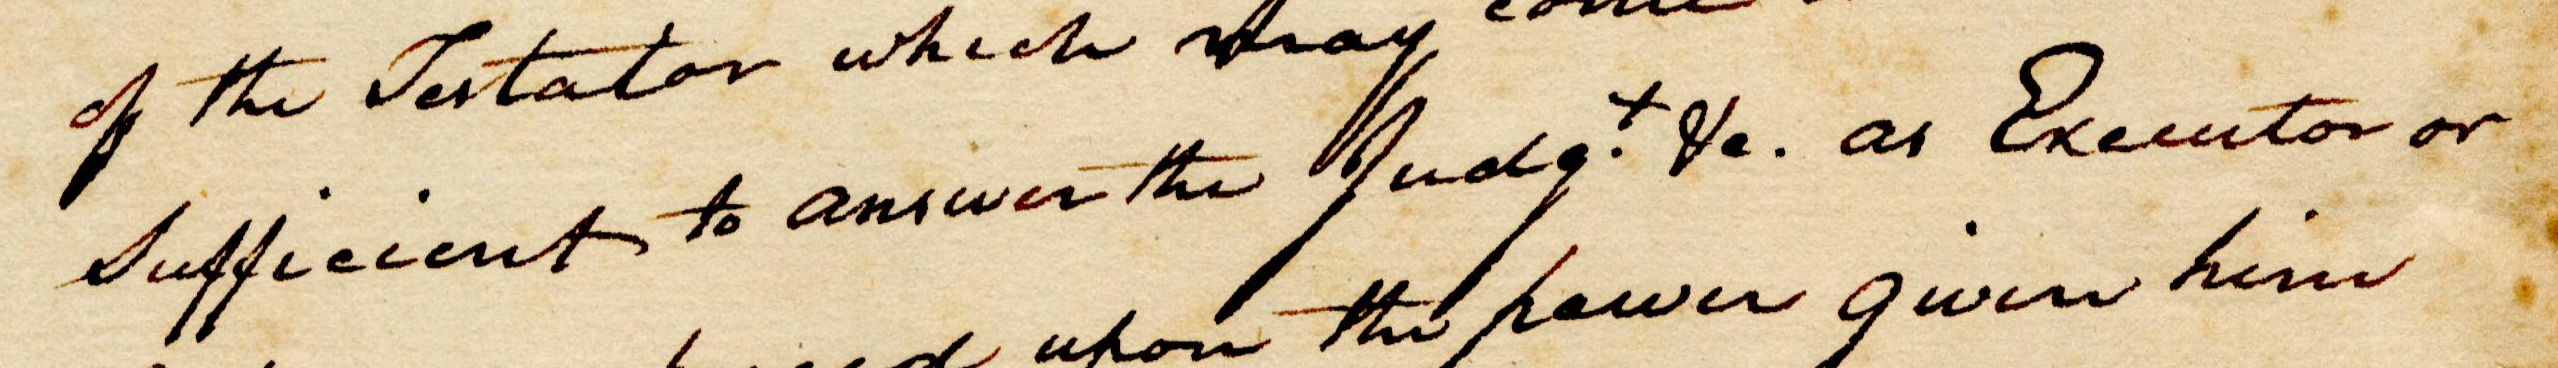sufficient to answer the Judg^t. &c. as Executor or
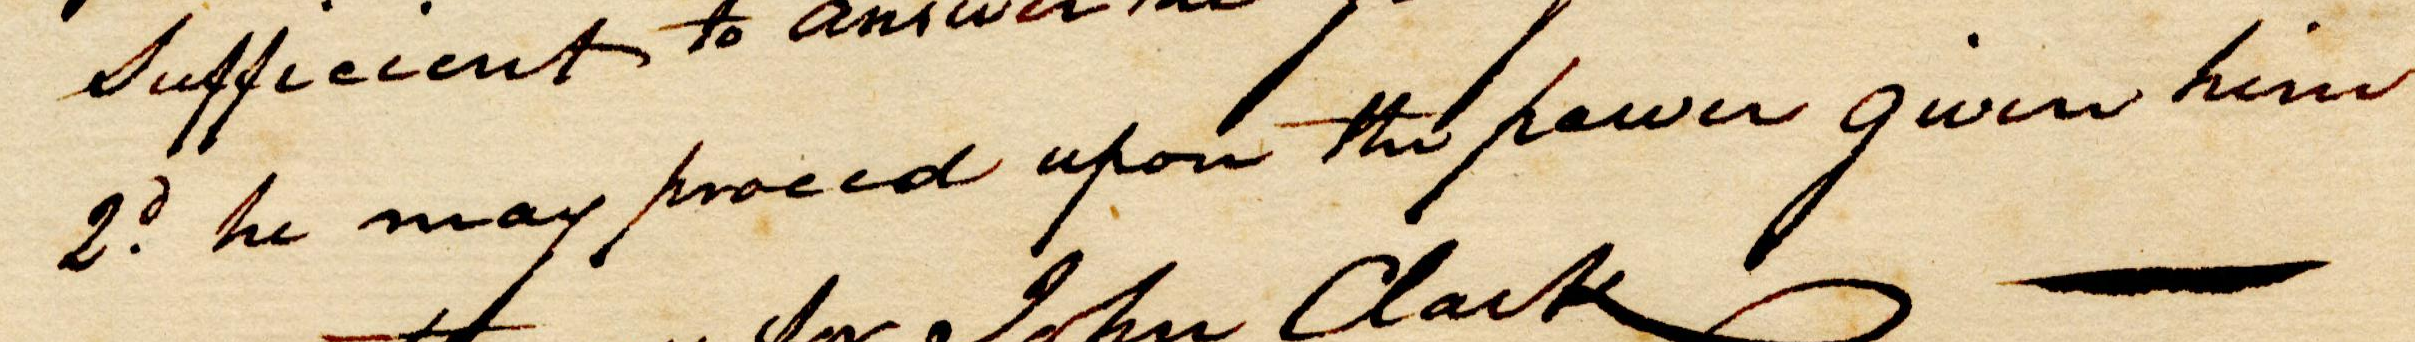2^d. he may proced upon the power given him
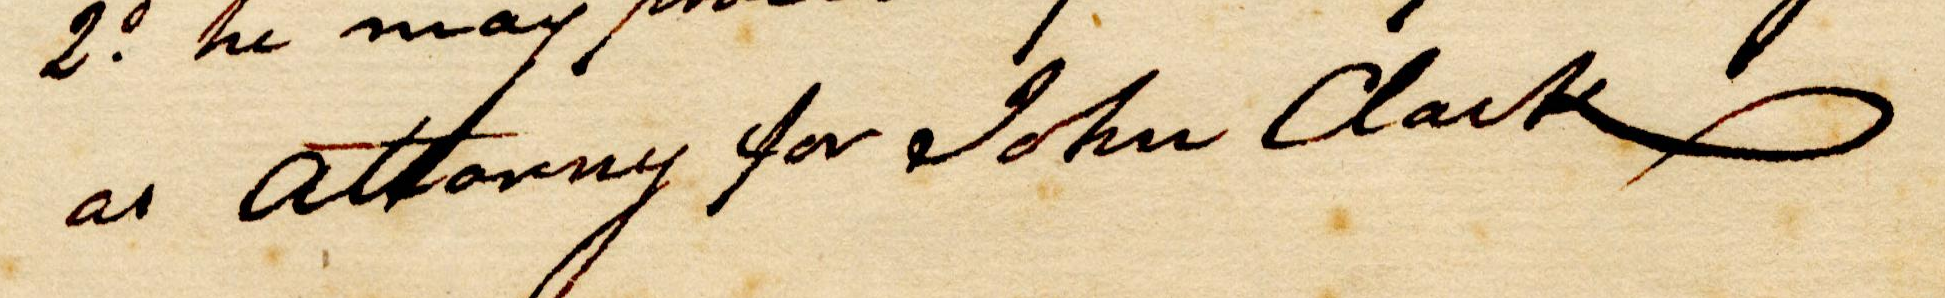as attorney for John Clark
